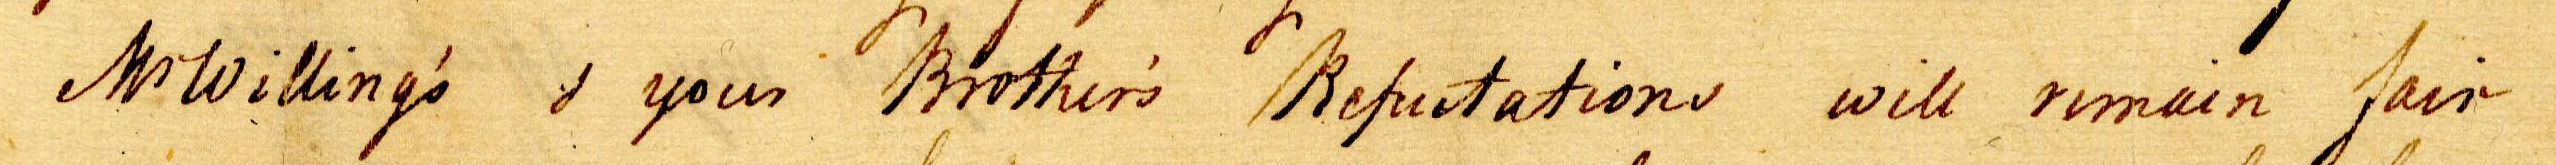M^r Willing's & your Brother's Reputations will remain fair
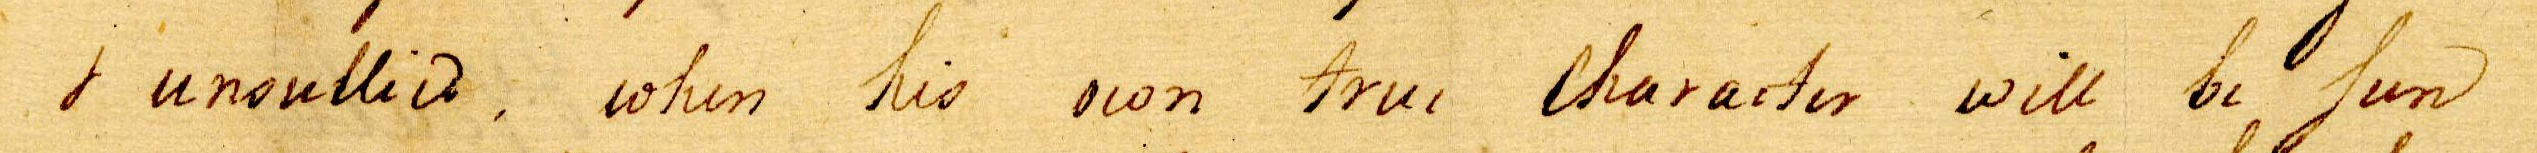& unsullied, when his own true character will be seen
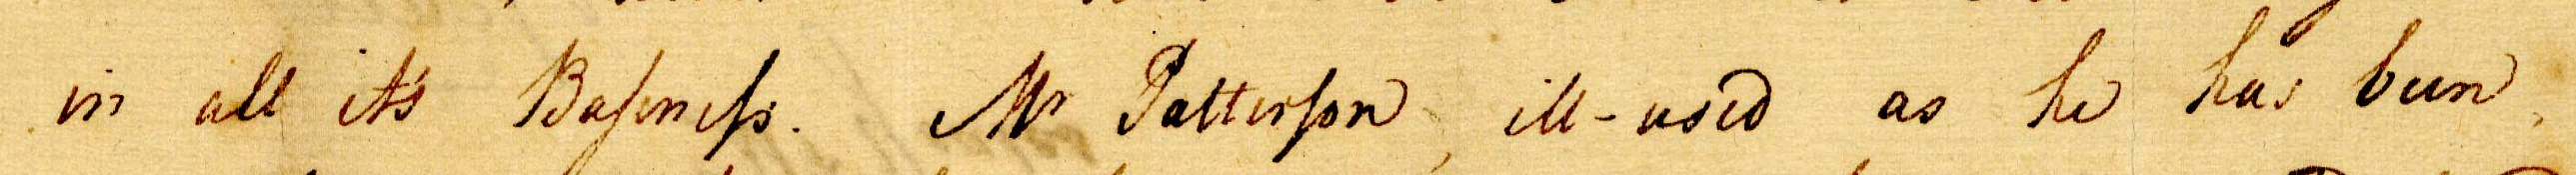in all its Baseness. M^r Patterson ill-used as he has been
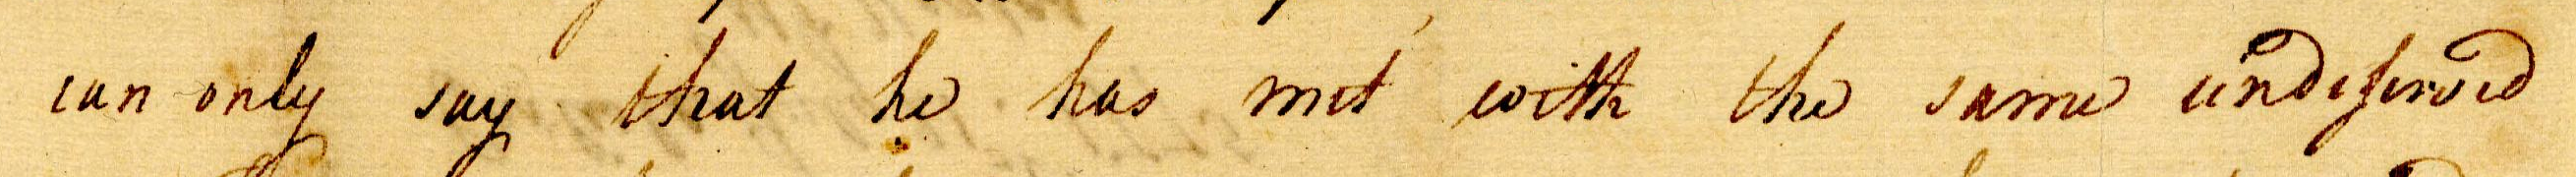can only say that he has met with the same undeserved
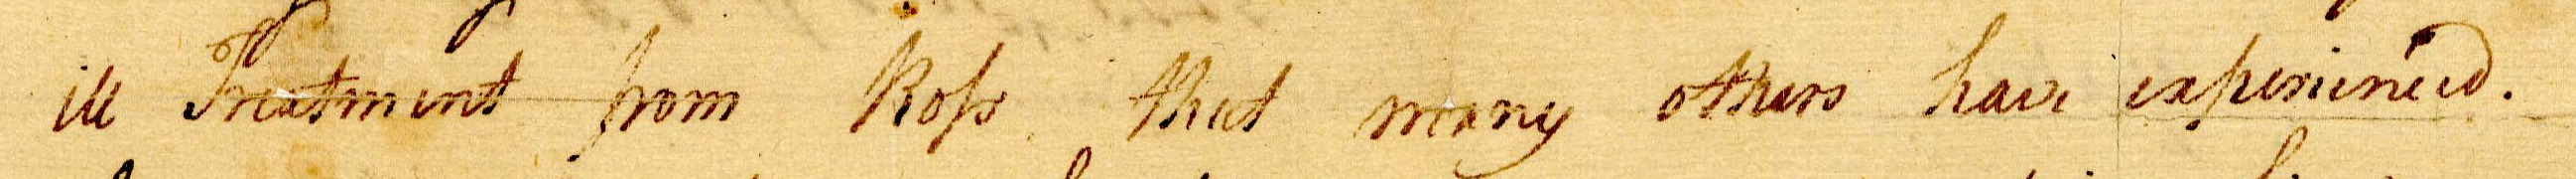ill Treatment from Ross that many others have experienced.
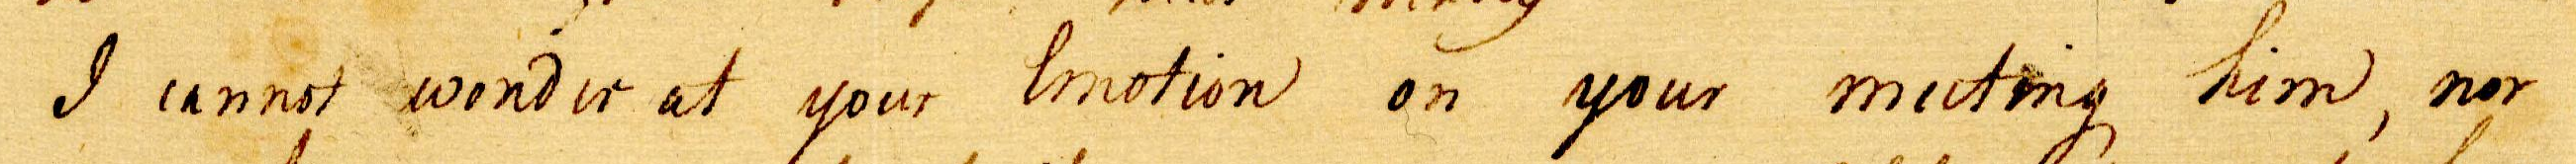I cannot wonder at your Emotion on your meeting him, nor
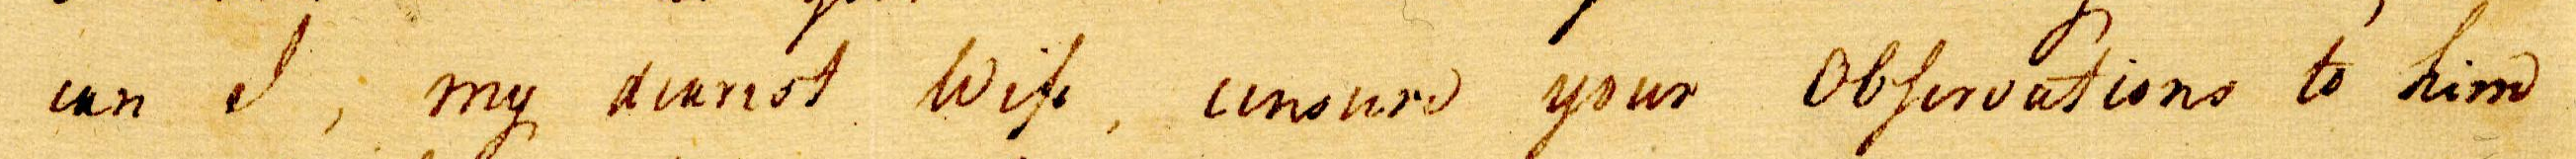can I, my dearest Wife, censure your Observations to him
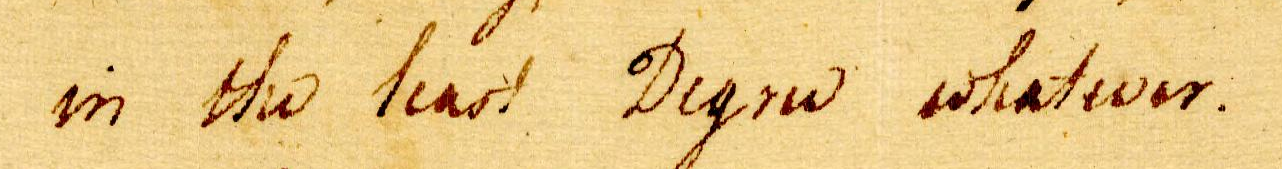in the least Degree whatever.
